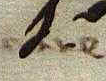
1.o
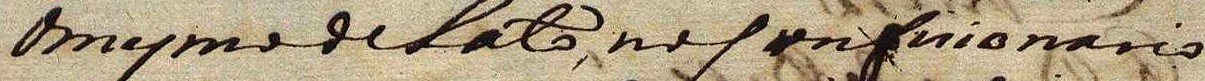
o mesmo delato, no Confisionario
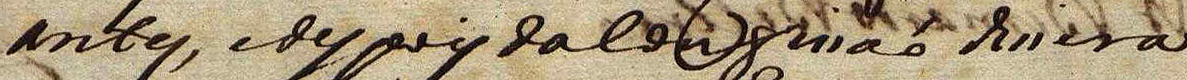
antes, e depois da confissaõ dissera
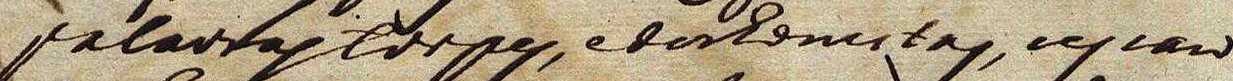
palavras torpes, e deshonestas, e escan
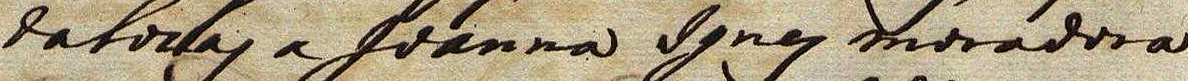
dalozas a Joanna Ignes moradora
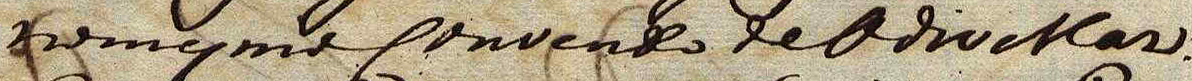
no mesmo Convento de Odivellas.
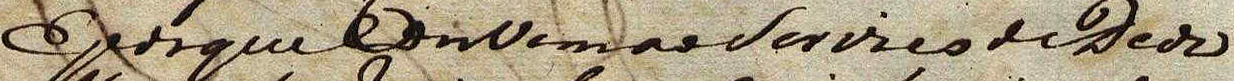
E porque convem ao serviço de Deos
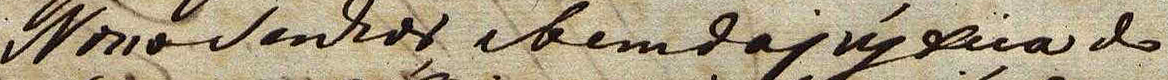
Nosso Senhor e bem da justiça do
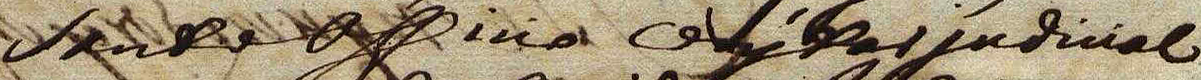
Santo Officio constar judicial
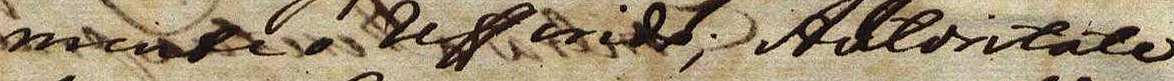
mente o Refferido; Autoritate
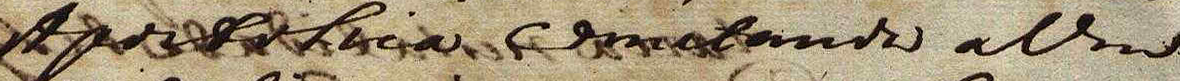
Apostolica cometemos a Vm
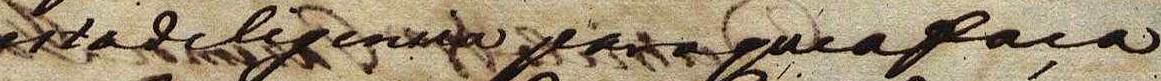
esta deligencia para que a faça
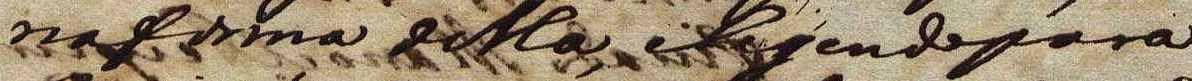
na forma della, elegendo para
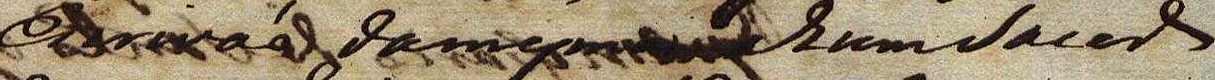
Escrivaõ da mesm_ hum sacer
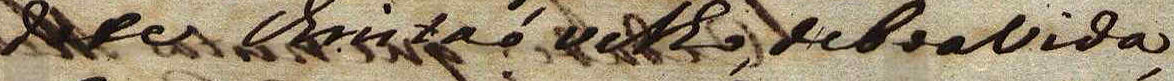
dote christaõ velho, de boa vida,
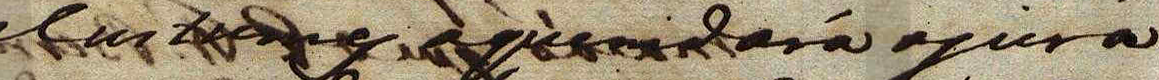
e custumes, a quem dará o jura
